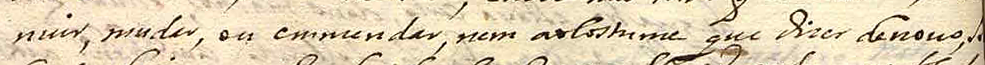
nuir, mudar, ou emmendar, nem ao costume que dizer de nouo, s
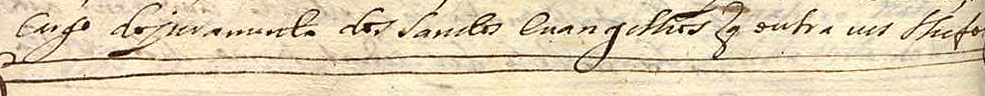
cargo do juramento dos Sanctos Euangelhos q̄ outra ues lhe fo
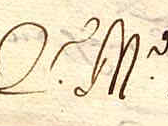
2.o M.o
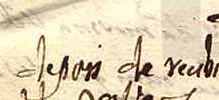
depois de recebi
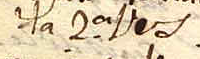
da 2.a Ves
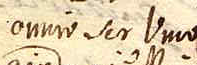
ouuio ser Uiuo
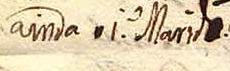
ainda o 1.o Marido
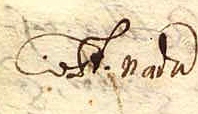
Cost. nada
